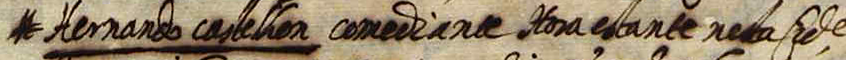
item Hernando castelhon comediante Hora estante nesta Cid.e
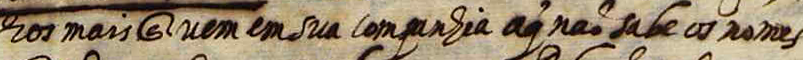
E os mais q̄ uem em sua companhia a q̄ não sabe os nomes
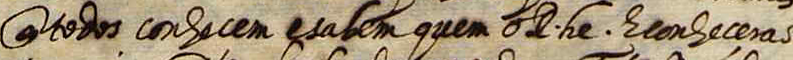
q̄ todos conhecem e sabem quem o R. he. E conheceraõ
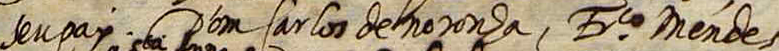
seu pay Dom Carlos de noronha, Fr.co Mendes
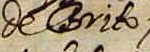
de Brito
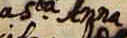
a s.ta Anna
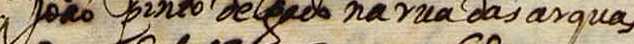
Joaõ pinto delgado na rua das arquas
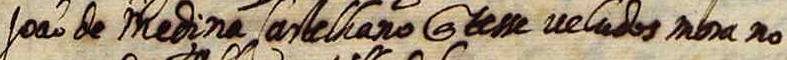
Joaõ de Medina Castelhano q̄ tesse ueludos mora no
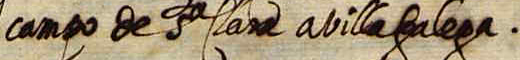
campo de sta Clara a villa galega.
